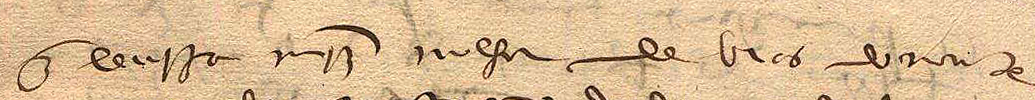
item llujza mj̄z molher de bras do monte
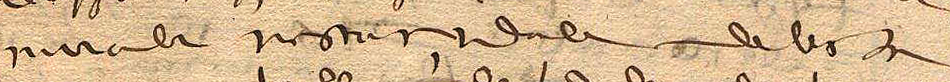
morador nesta cidade de beJa
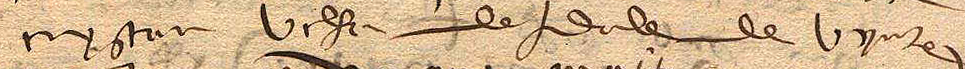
crystam velha de Jdade de vynte
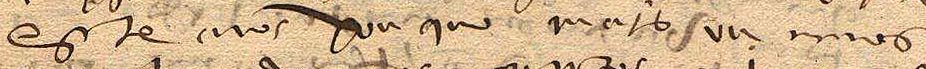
e sete anos pouquo majs ou menos
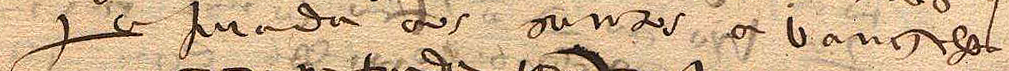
ta Jurada aos santos avangelhos
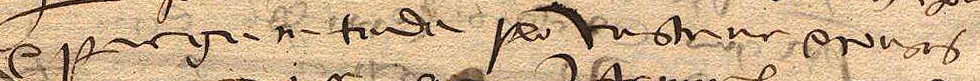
e pregumtada plō custume e cousas
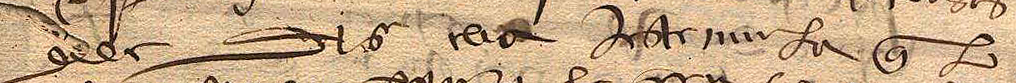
dele dise ella testemuha q̄ ho
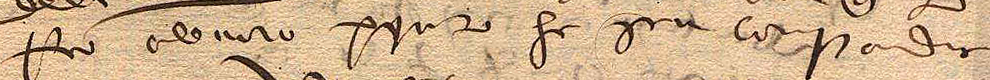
Reo alluoro pynto he seu compadre
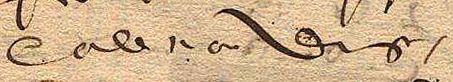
e all nā dise /
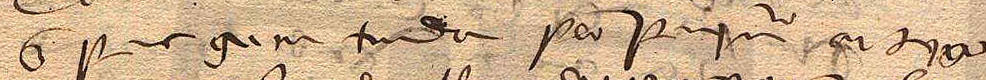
item pregumtada plō prymro artygo
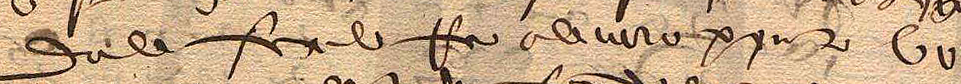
da defesa do Reo alluoro pynto bo
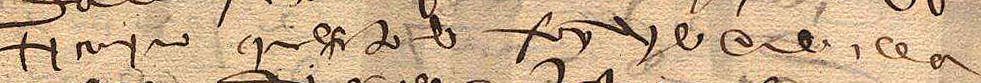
tycayro que lhe todo foy lydo e declla
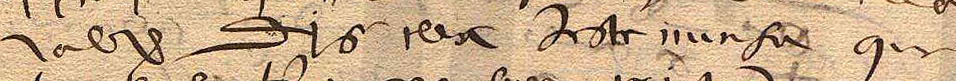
rado . dyse ella testemunha que
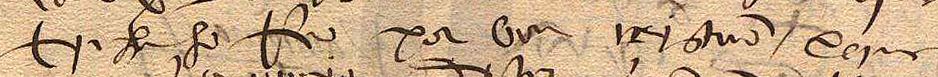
tynha ho Reo por bom crystaõ / e que
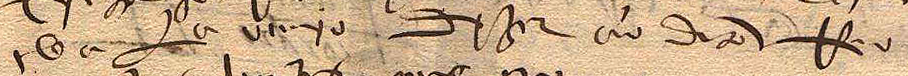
ella ta ouuyo dyzer ao ditō Reo
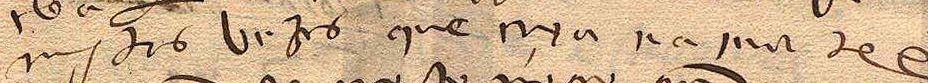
mujtas vezes que crya na morte e
